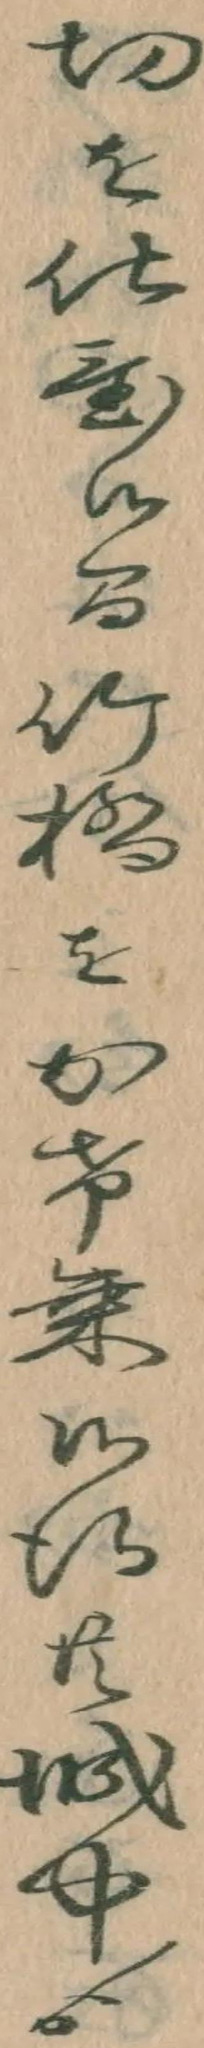切を仕置候間竹橋を加希乗候得共城中ゟ
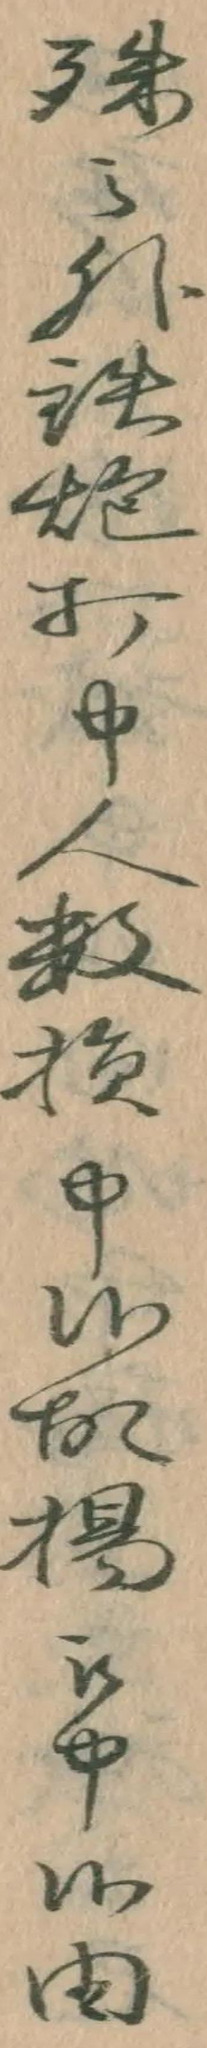殊之外鉄炮打申人数損申候故揚被申候由
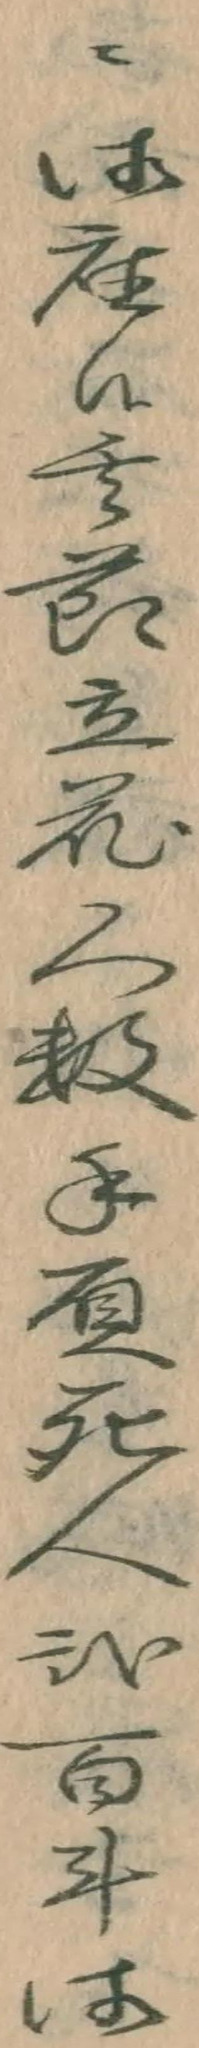に御座候其節立花人数手負死人弐百斗御
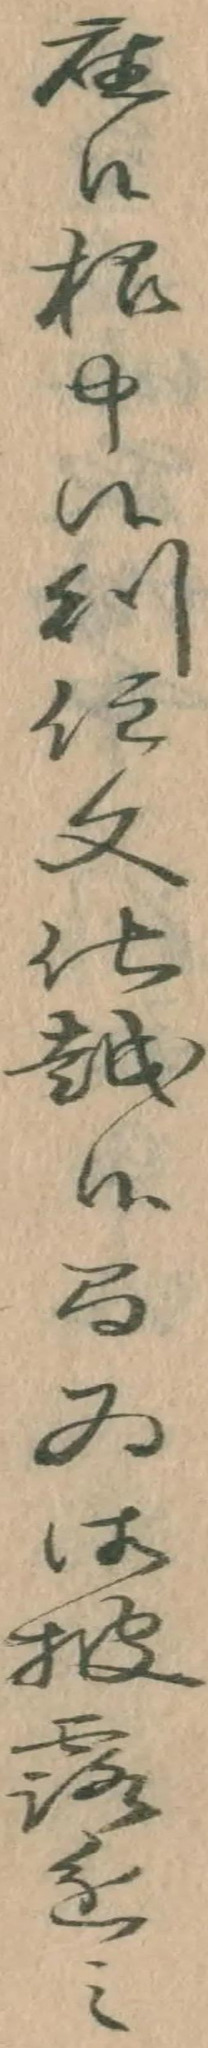座候様申候則住又仕越候間ゐ御披露進之
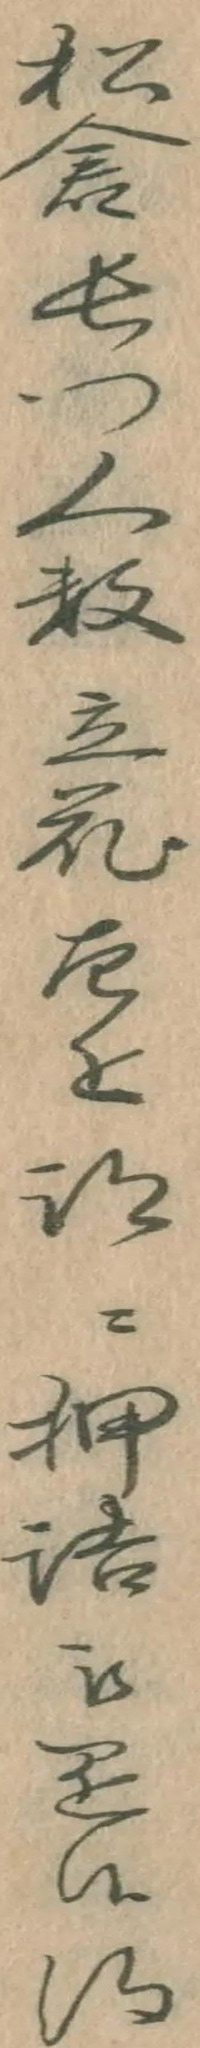一松倉長門人数立花左近跡に押詰被懸候得
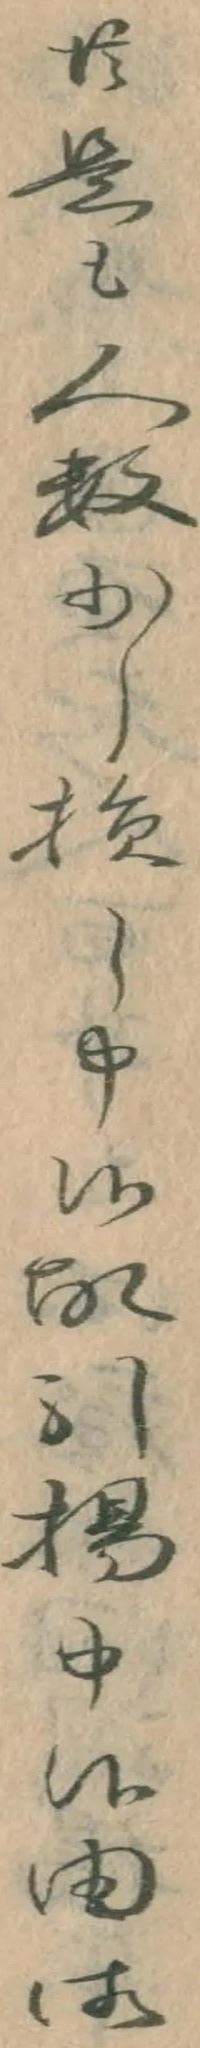共是も人数少し損し申候故引揚申候由御
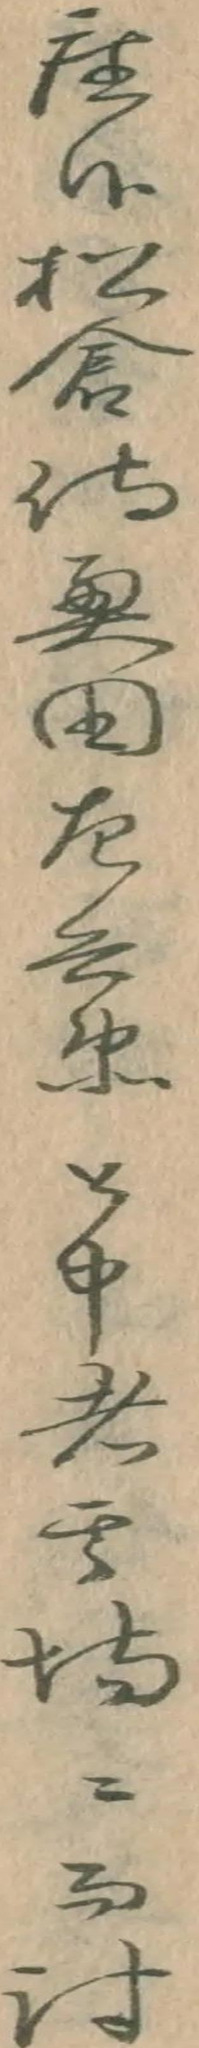座候松倉侍奥田左兵衛と申者其場に而討
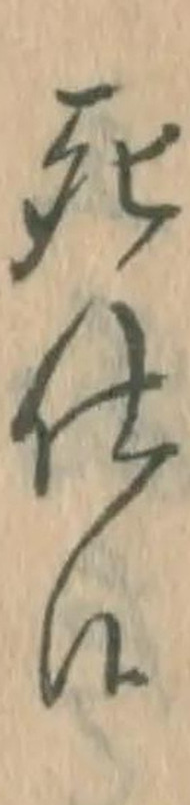死仕候

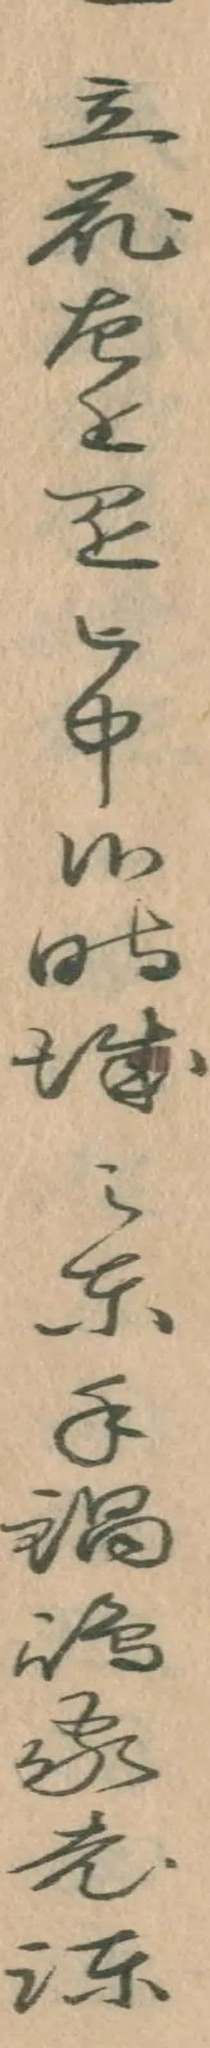一立花左近懸被申候時城之東手鍋島家老諌
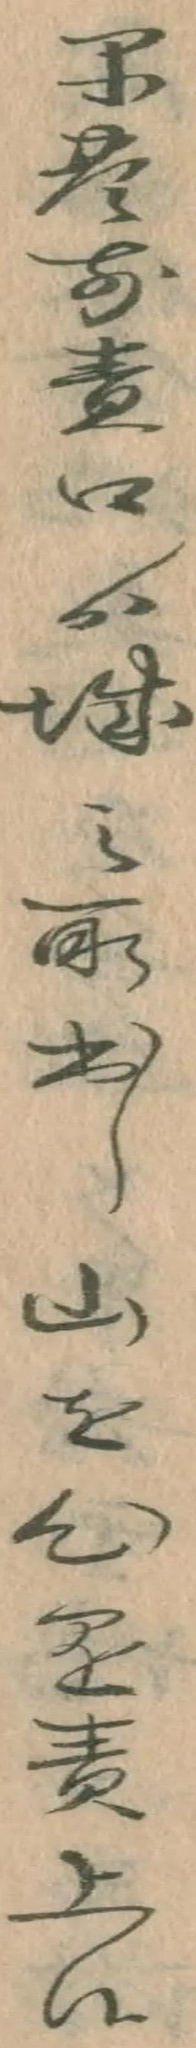早豊前責口ゟ城之取出し山を心懸責上候
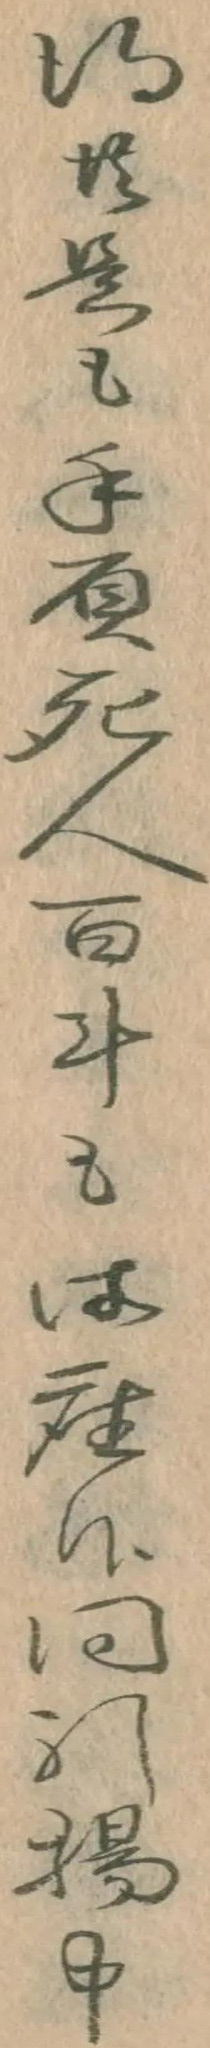得共是も手負死人百斗も御座候同引揚申
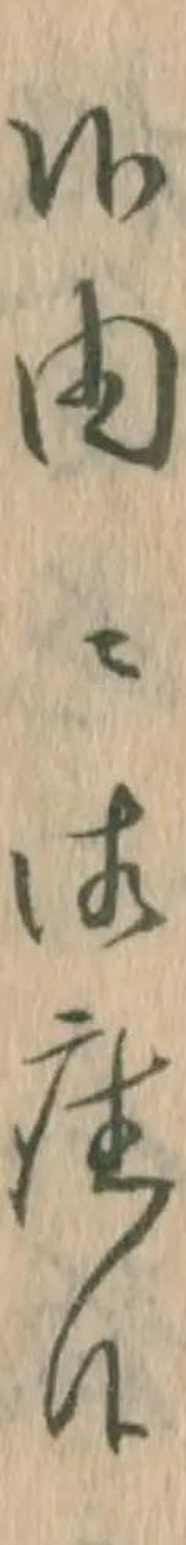候由に御座候
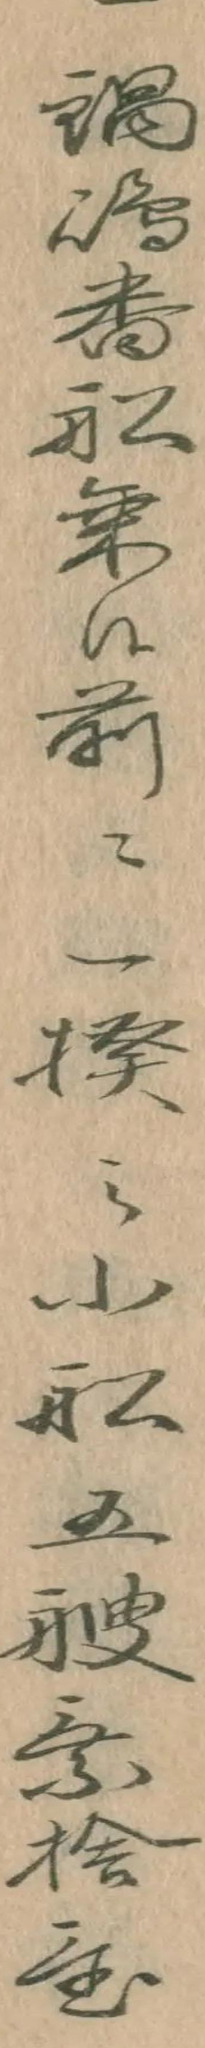一鍋島番舩乗候前に一揆之小舩五艘乗捨置
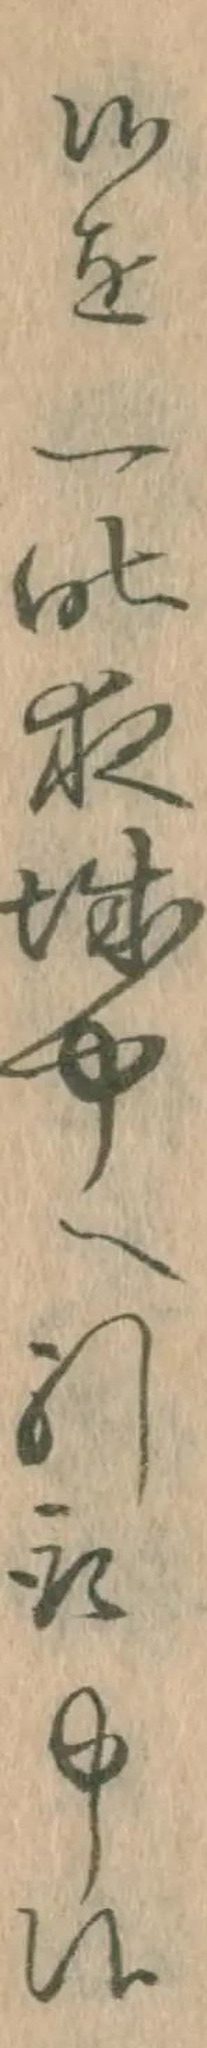候を一昨夜城中へ引取申候
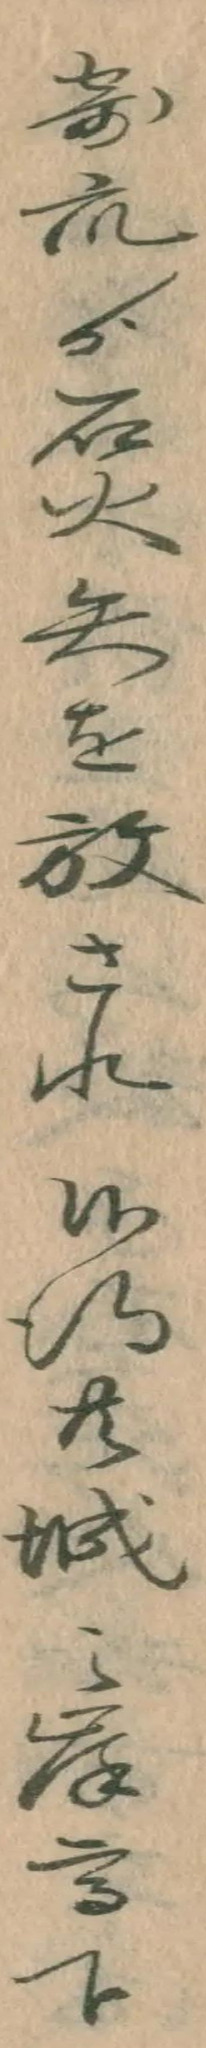一寄衆ゟ石火矢を放され候得共城之岸高下
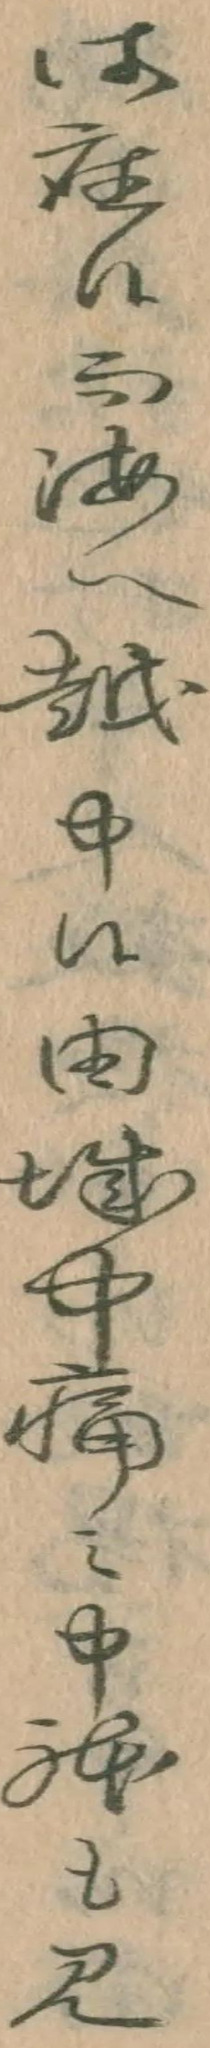御座候而海へ越申候由城中痛み申躰も見
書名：切支丹御退治記 49巻. [4]
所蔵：国立国会図書館 National Diet Library, JAPAN
